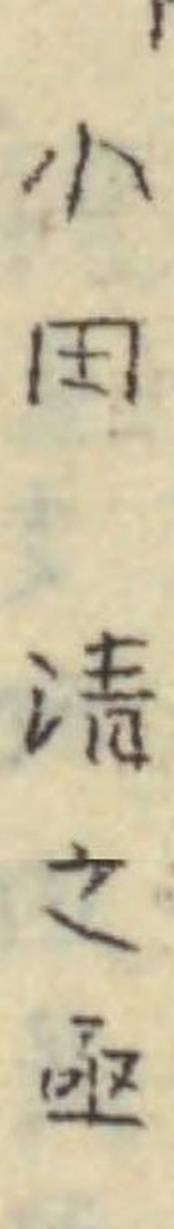小田清之丞
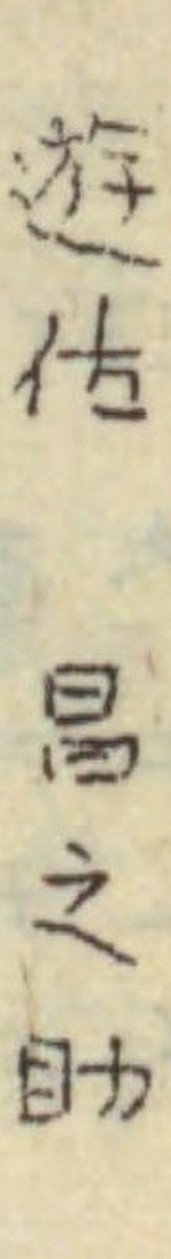遊佐昌之助
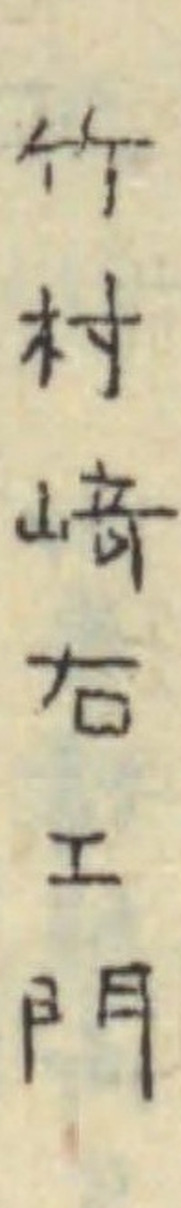竹村崎右エ門
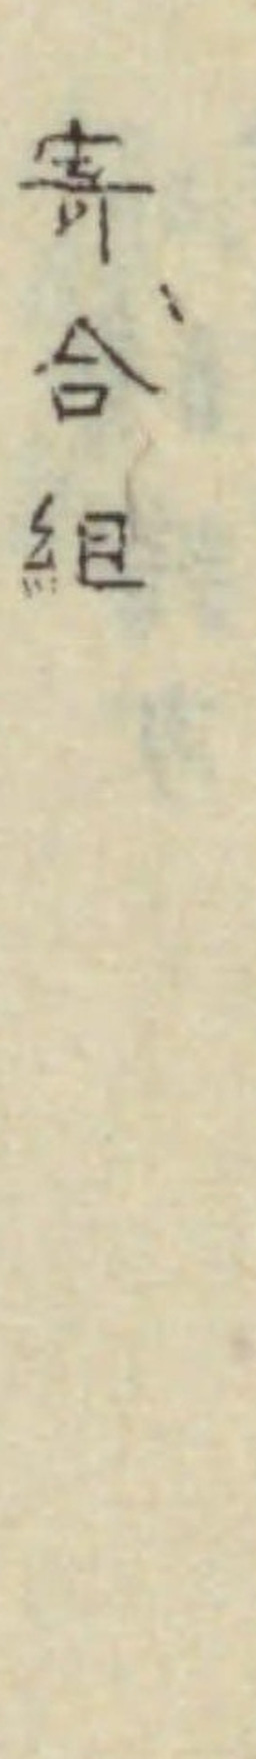寄合組
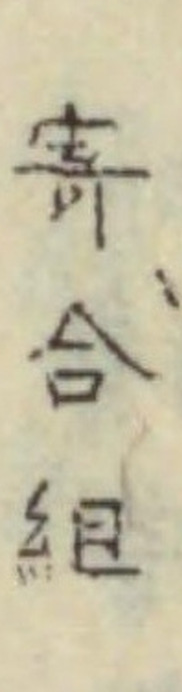寄合組
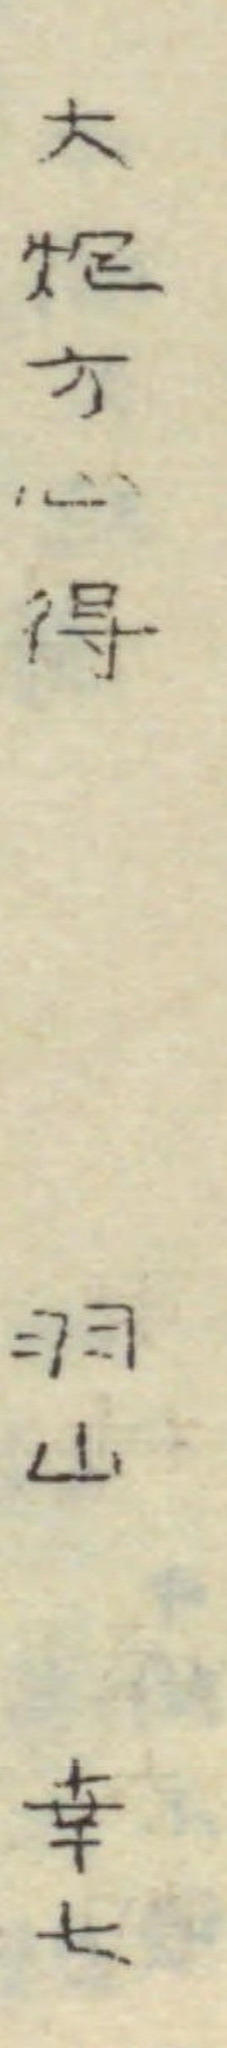大炮方心得羽山幸七
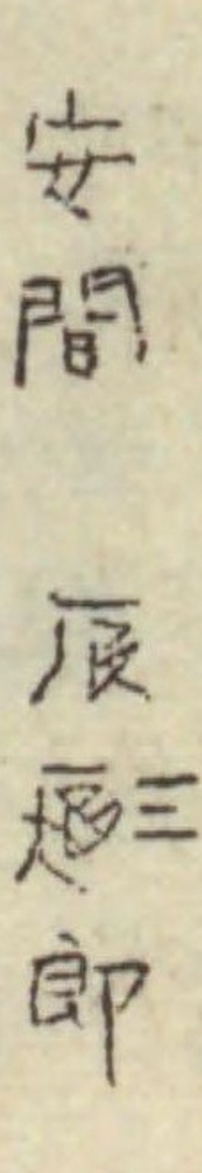安間辰三郎
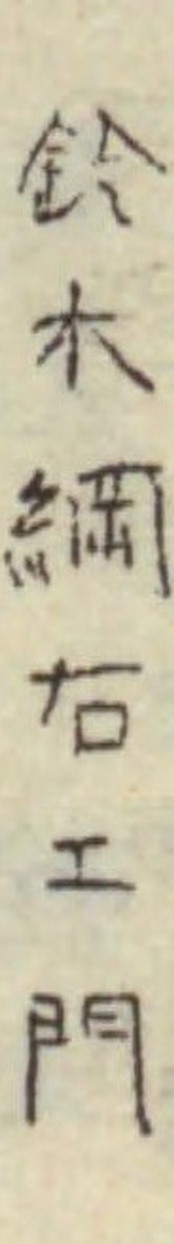鈴木綱右エ門
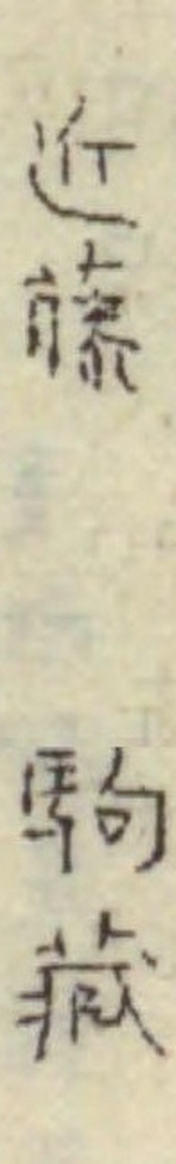近藤駒蔵
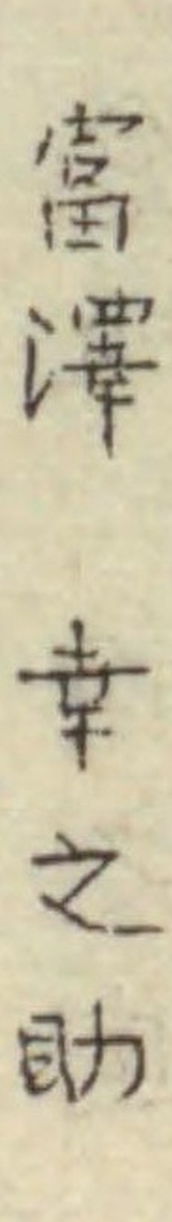富沢幸之助
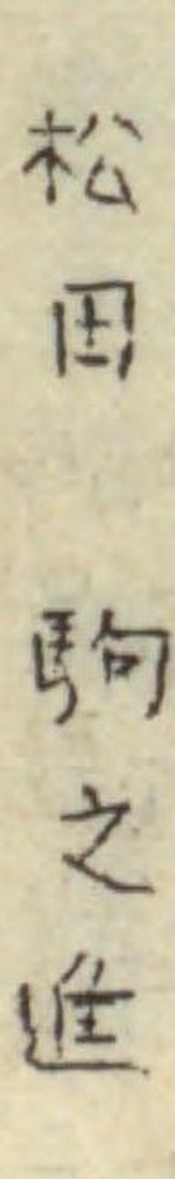松田駒之進
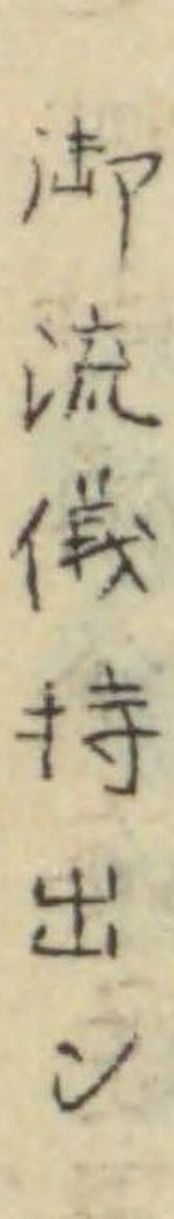御流儀持出シ

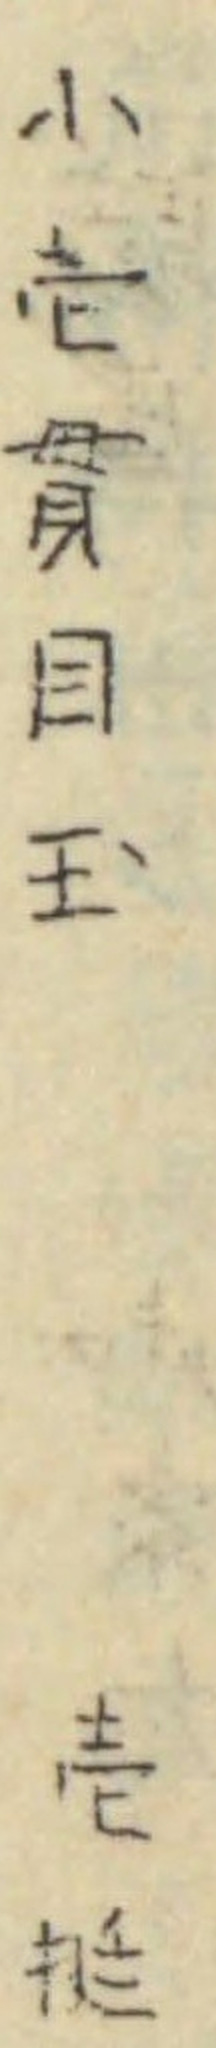小一壱貫目玉壱挺
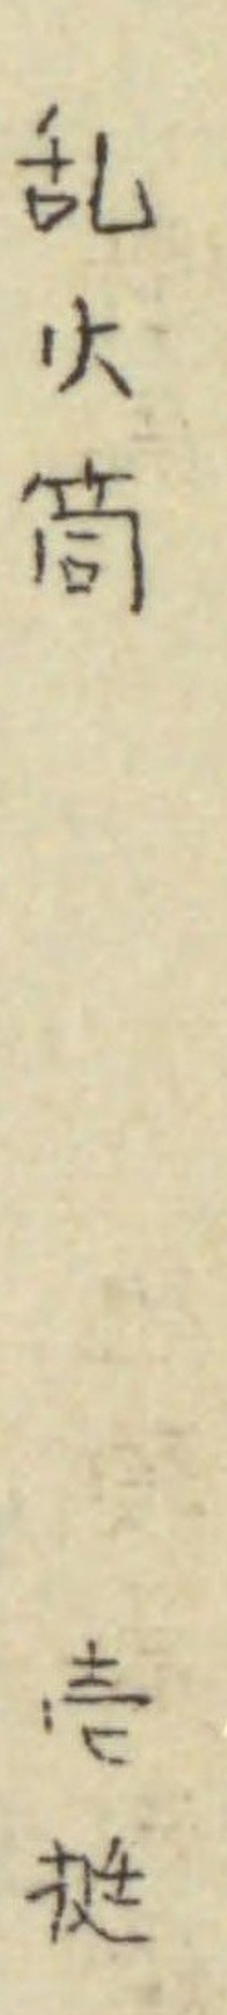乱火筒壱挺
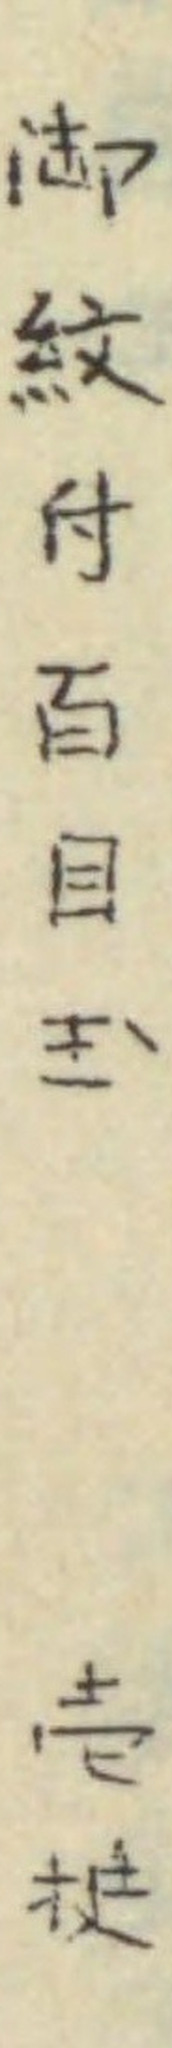御紋付百目玉壱挺
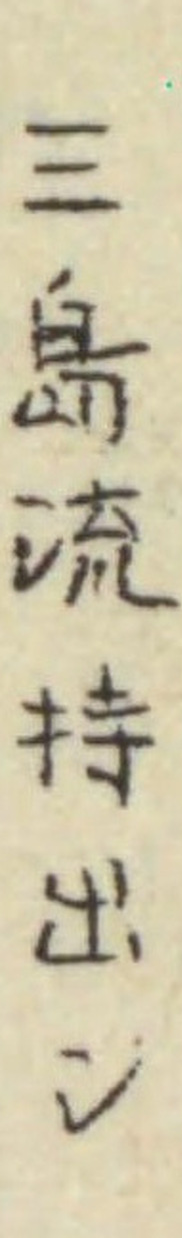三島流持出シ
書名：三河吉田藩動員史料
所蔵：国立国会図書館 National Diet Library, JAPAN
